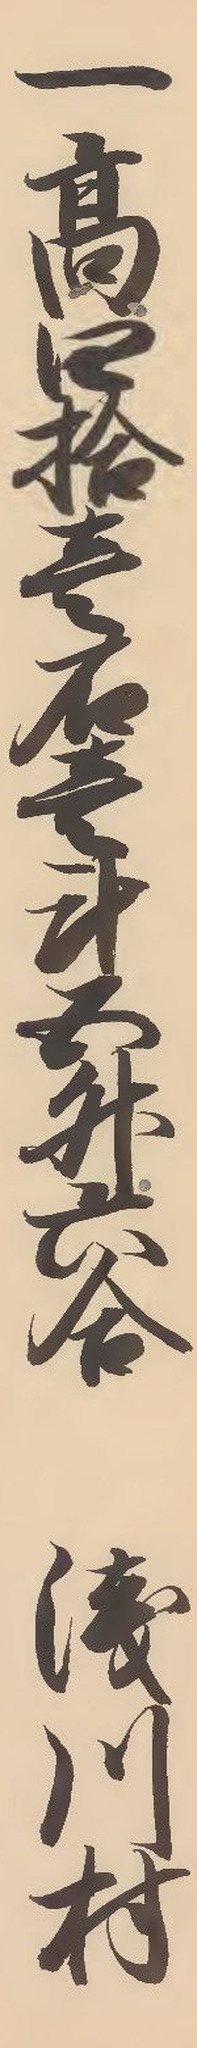一高四拾壱石壱斗五升六合浅川村
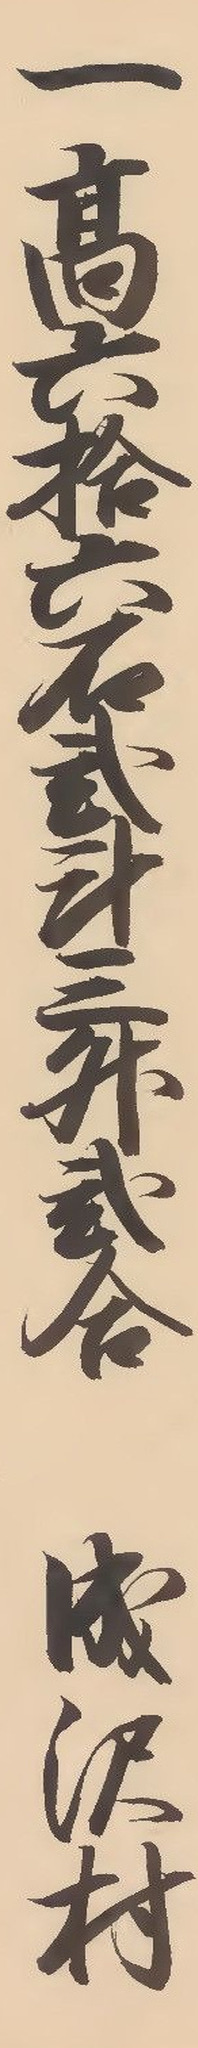一高六拾六石弐斗三升弐合成沢村
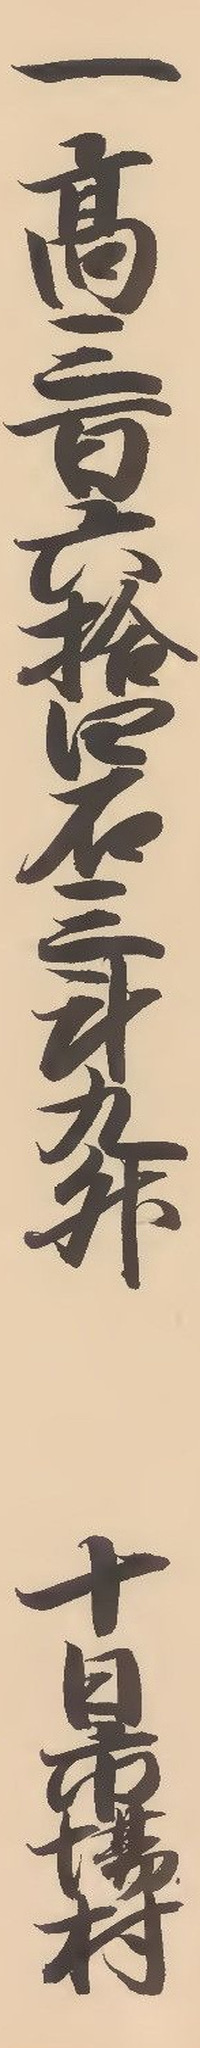一高三百六拾四石三斗九升十日市場村
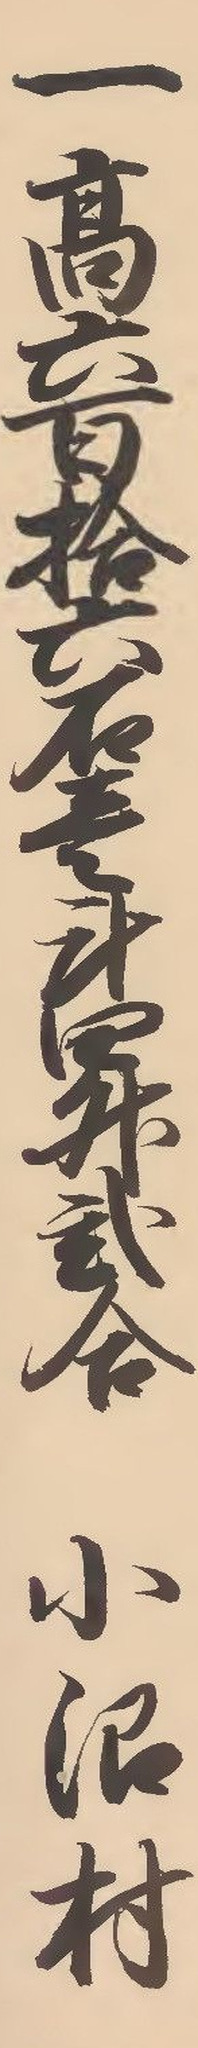一高六百拾六石壱斗四升弐合小沼村
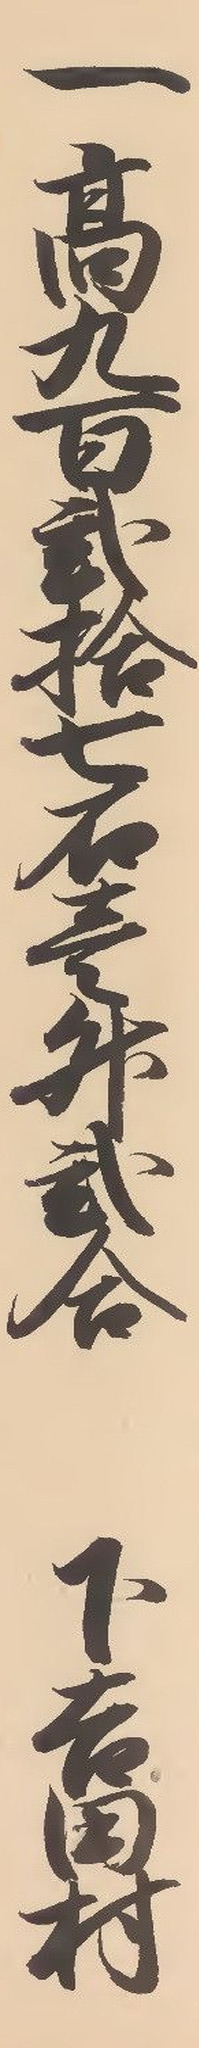一高九百弐拾七石壱升弐合下吉田村
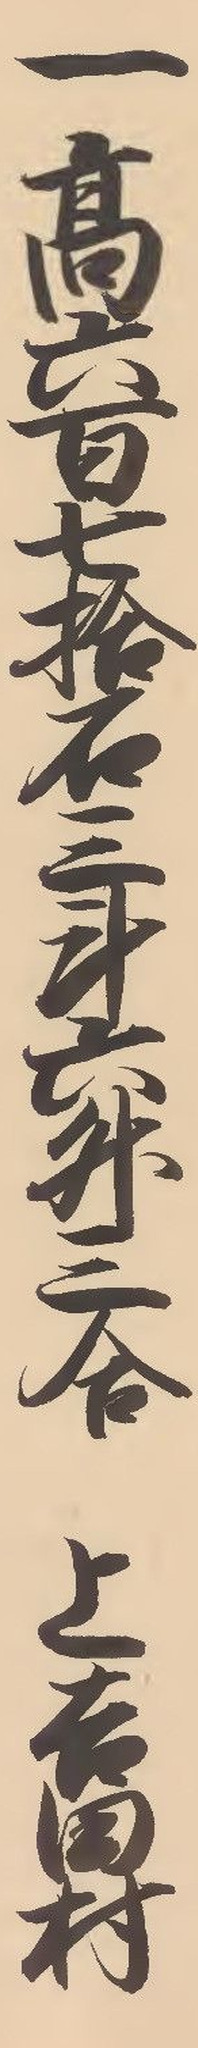一高六百七拾石三斗六升三合上吉田村
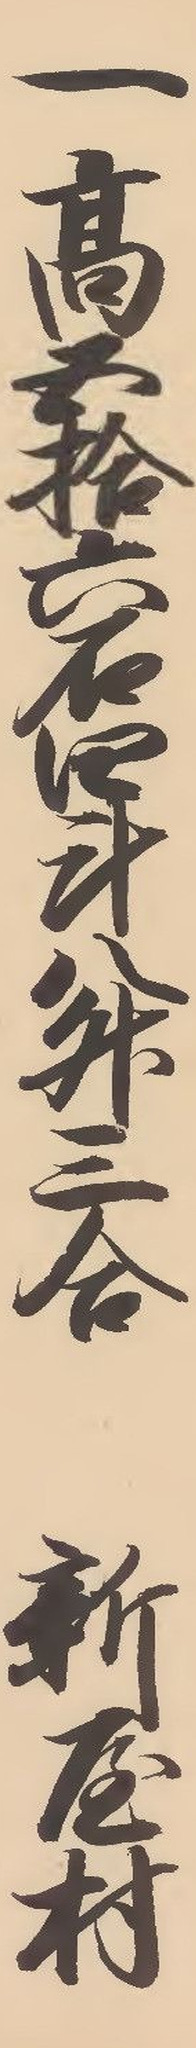一高五拾六石四斗八升三合新屋村
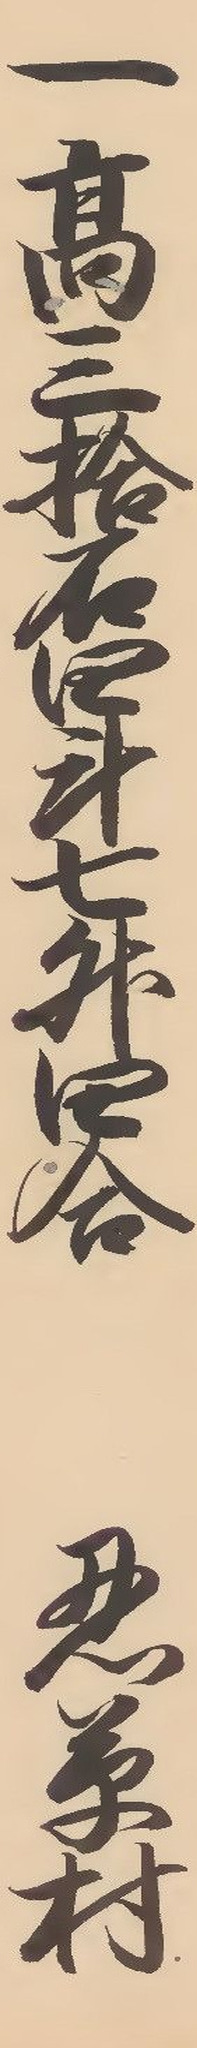一高三拾石四斗七升四合忍草村

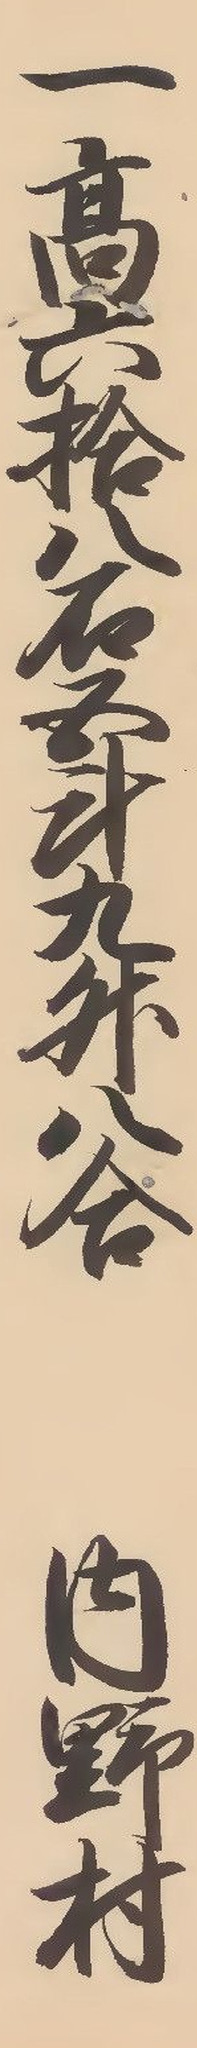一高六拾八石五斗九升八合内野村
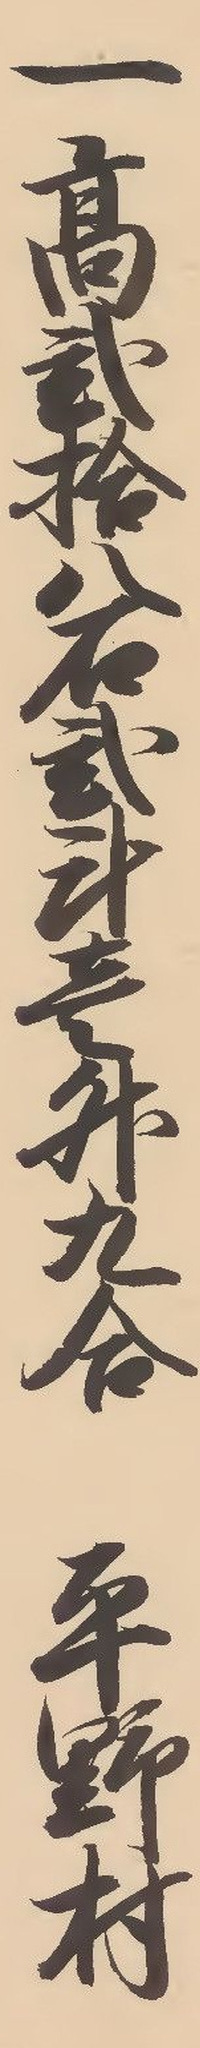一高弐拾八石弐斗壱升九合平野村
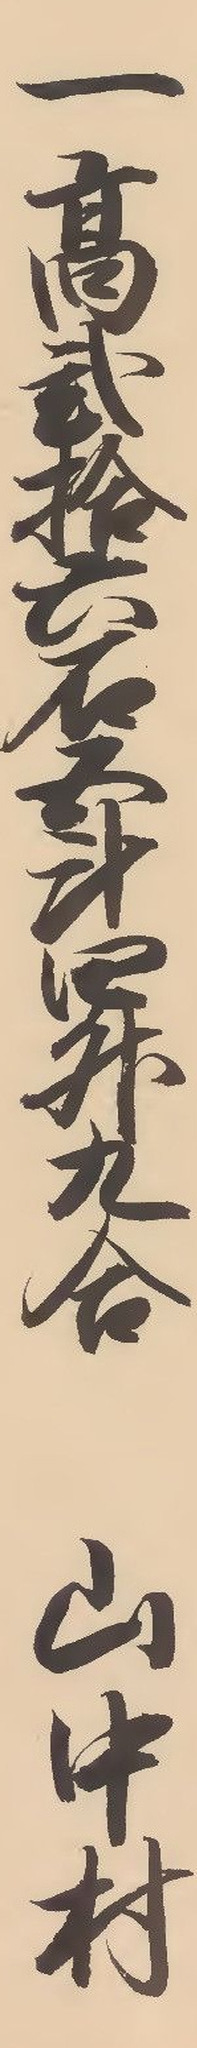一高弐拾六石五斗四升九合山中村
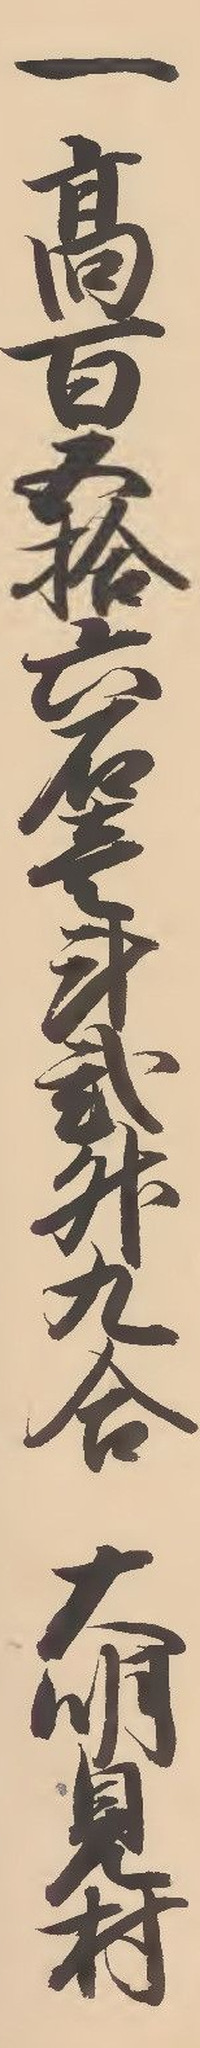一高百五拾六石壱斗弐升九合大明見村
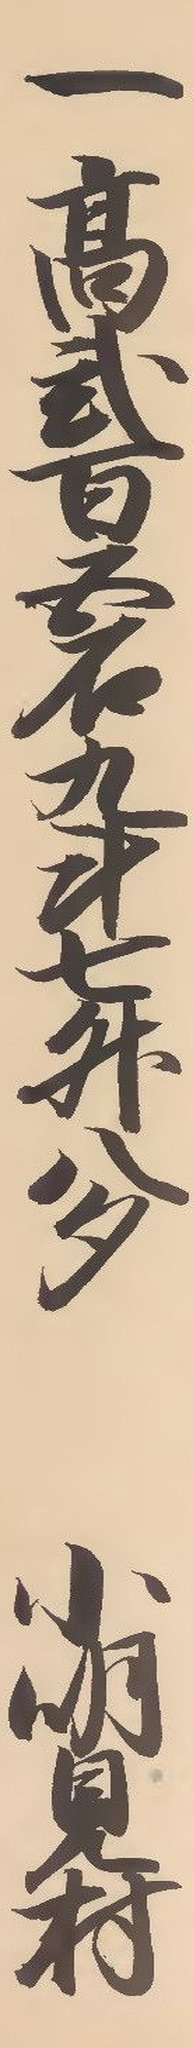一高弐百五石九斗七升八勺小明見村
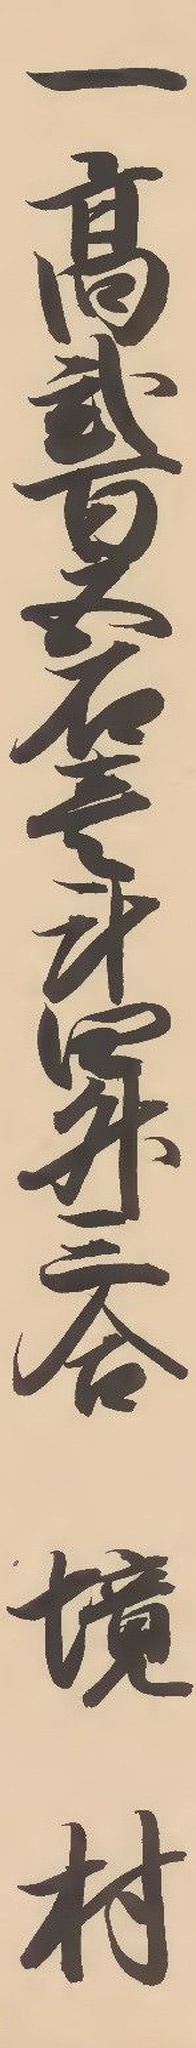一高弐百五石壱斗四升三合境村
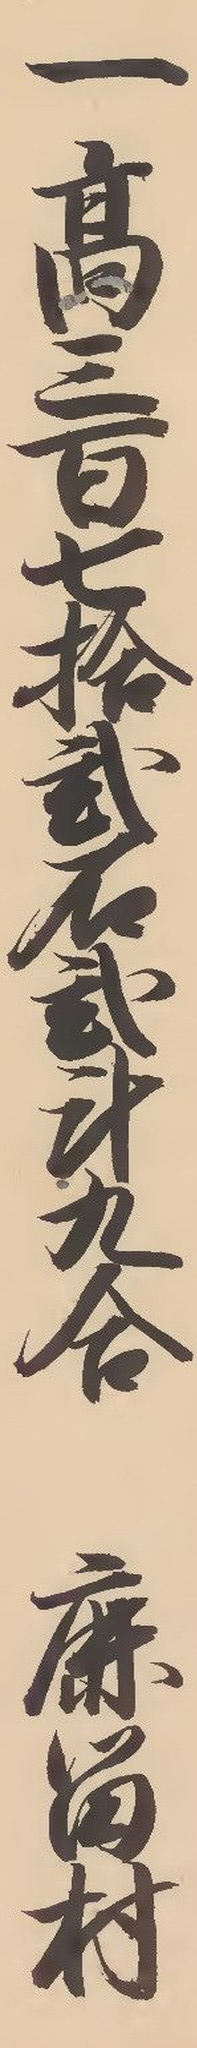一高三百七拾弐石弐斗九合鹿留村

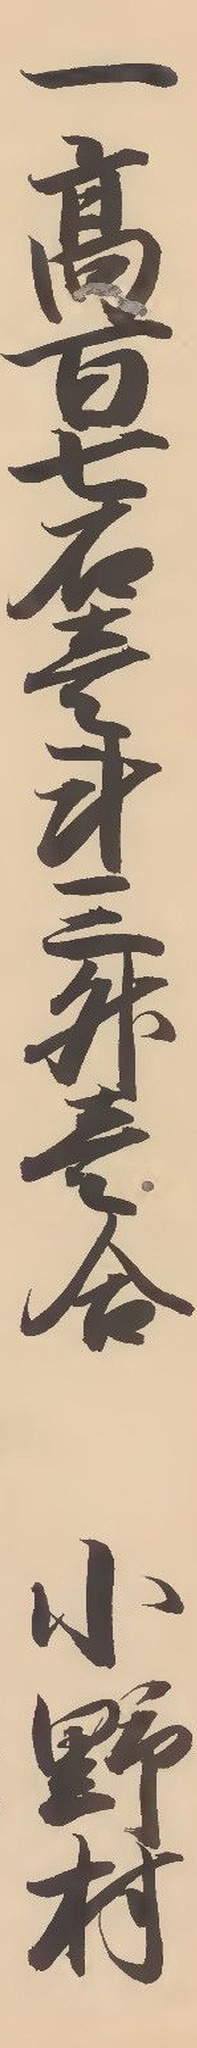一高百七石壱斗三升壱合小野村
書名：甲斐国郷帳
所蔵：国立公文書館 National Archives of Japan
